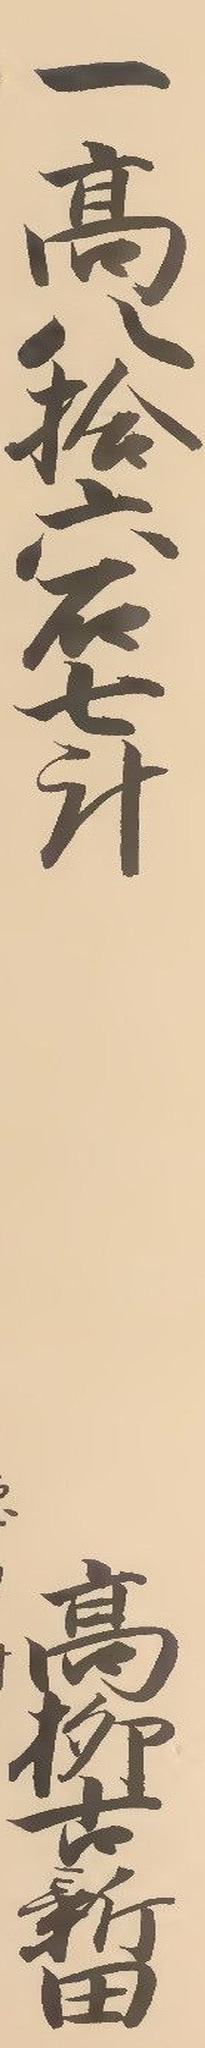一高八拾六石七斗高柳古新田
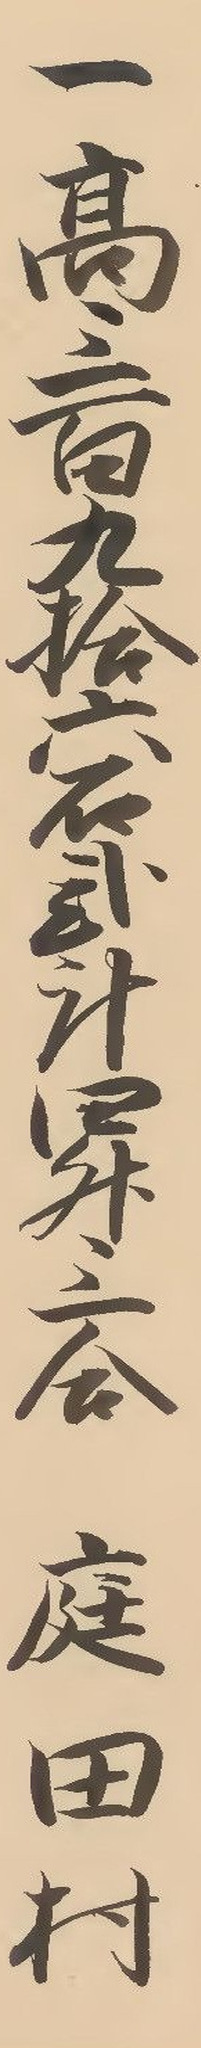一高三百九拾六石弐斗四升三合庭田村

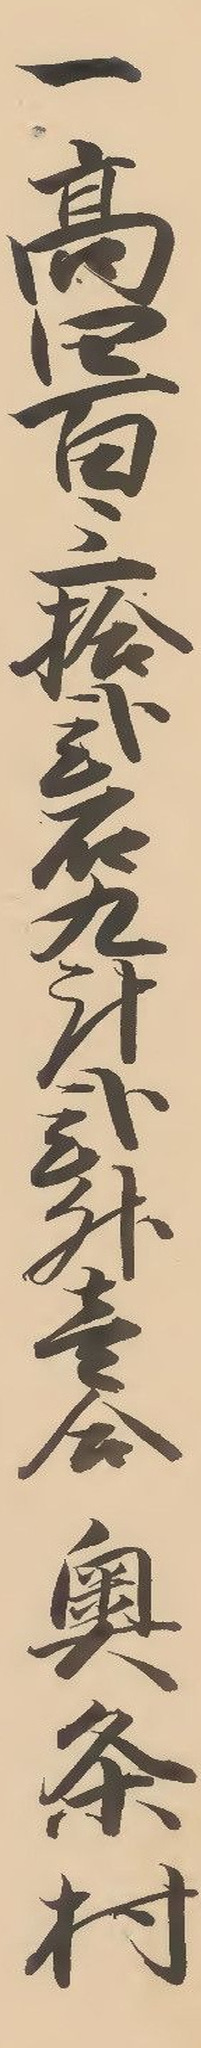一高四百三拾弐石九斗弐升壱合奥条村
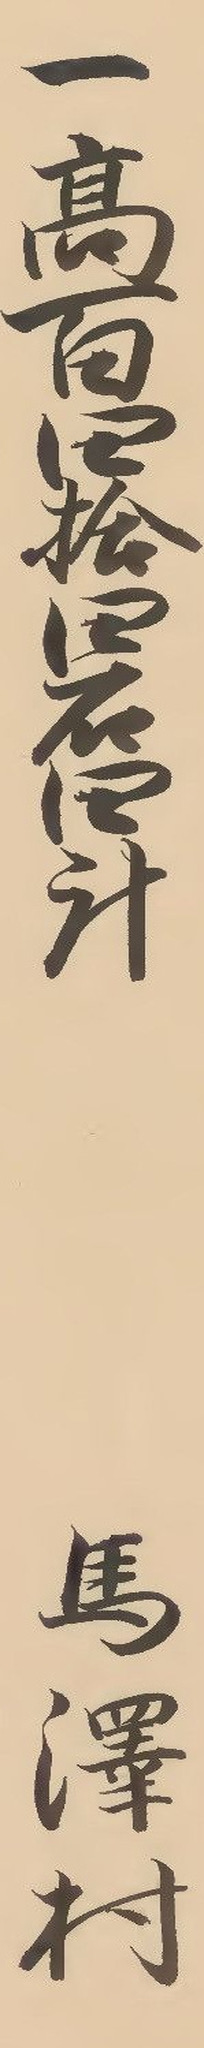一高百四拾四石四斗馬沢村
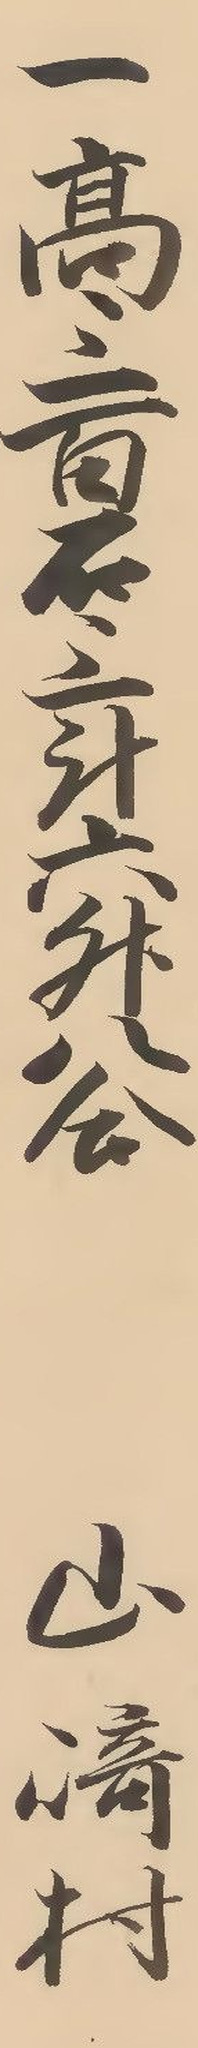一高三百石三斗六升八合山崎村
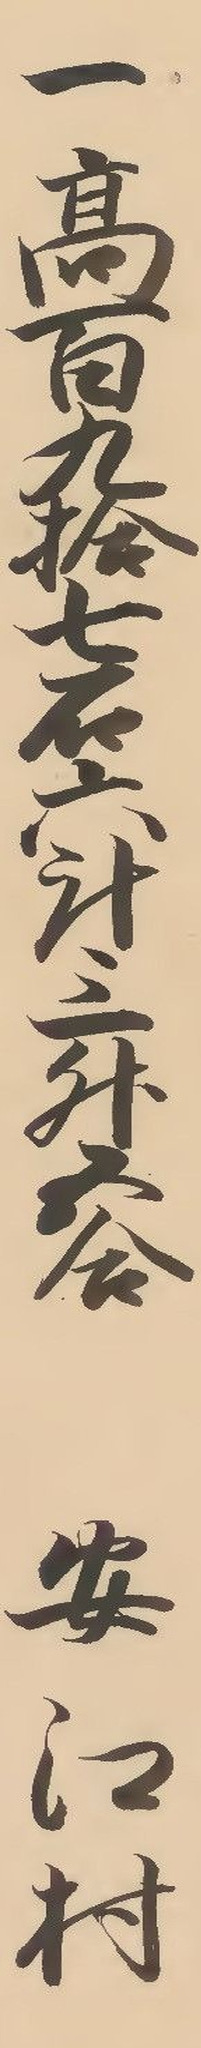一高百九拾七石六斗三升五合安江村
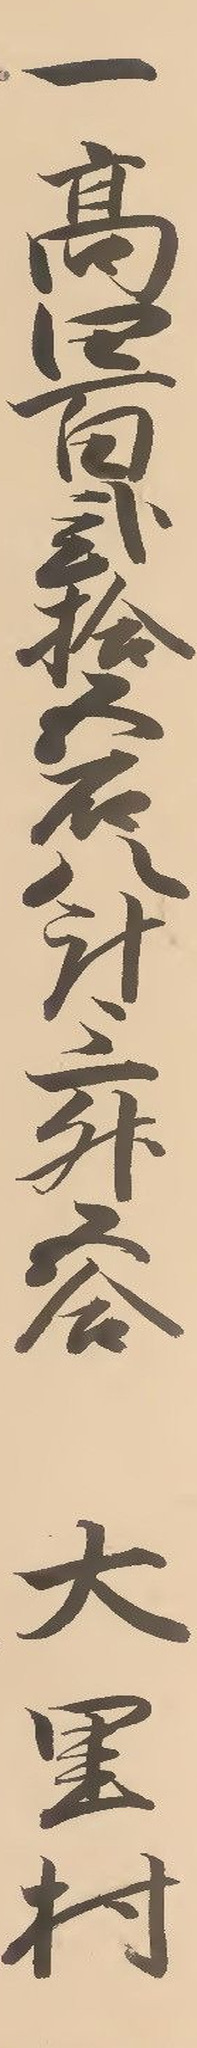一高四百弐拾五石八斗三升五合大里村
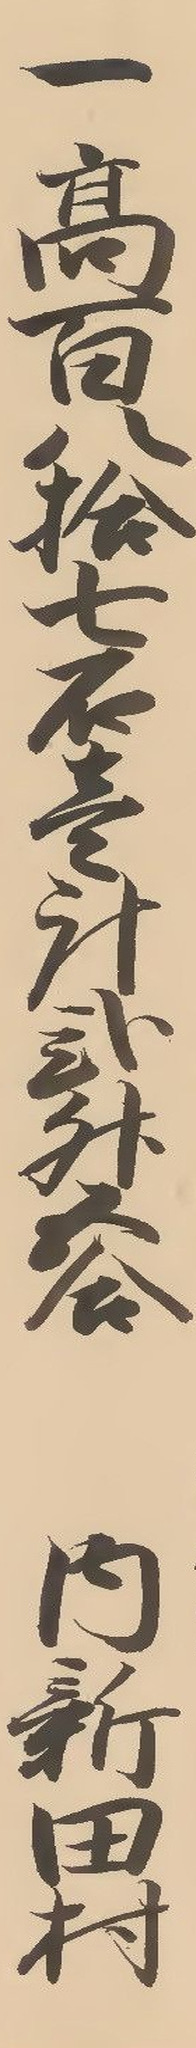一高百九拾七石六斗三升五合安江村

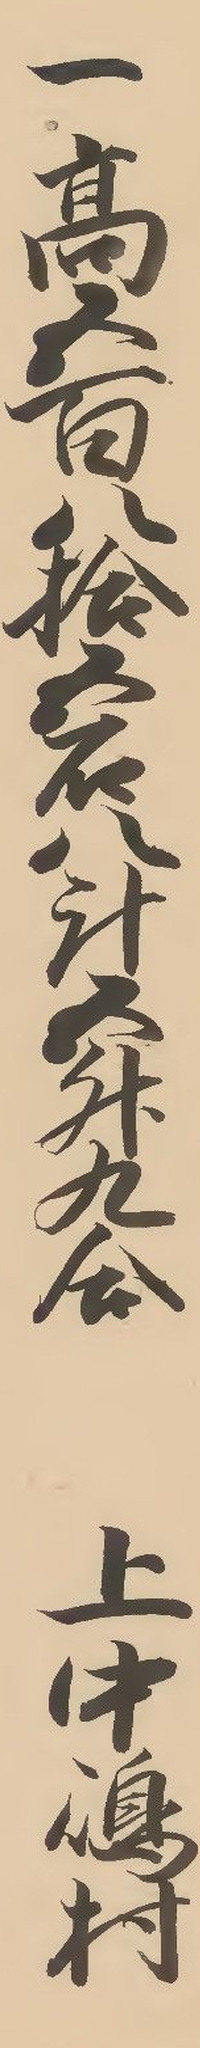一高五百八拾五石八斗五升九合上中島村
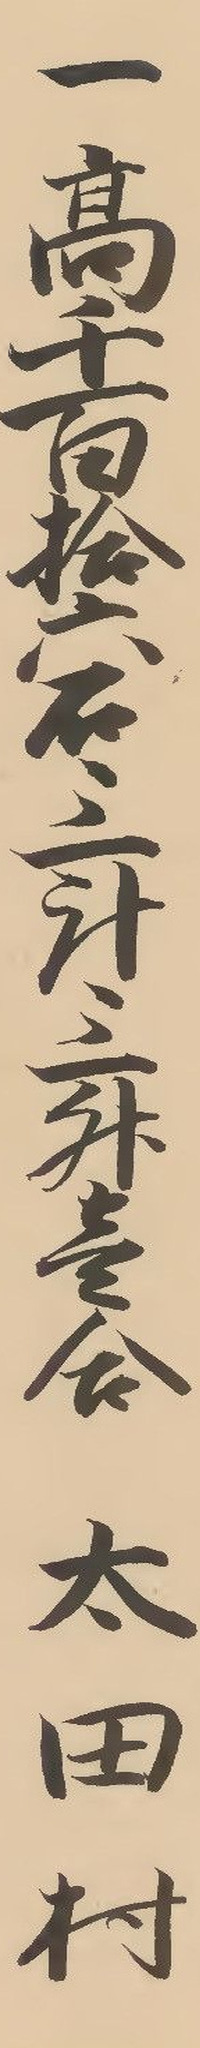一高千百拾六石三斗三升壱合太田村
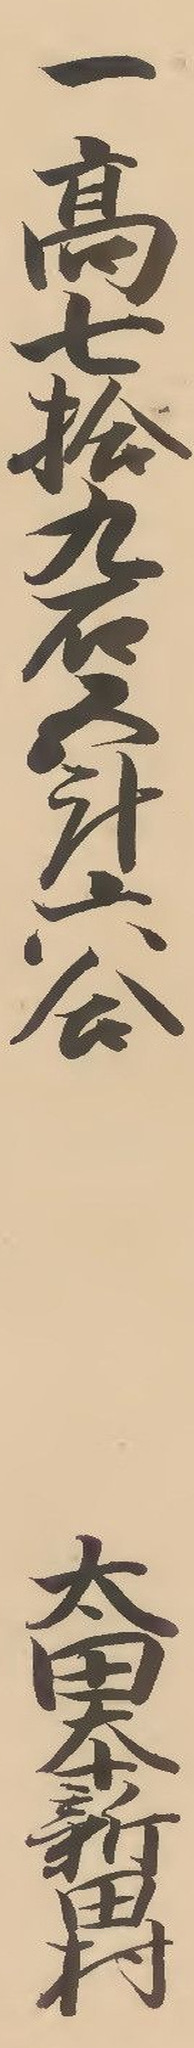一高七拾九石五斗六合太田本新田村
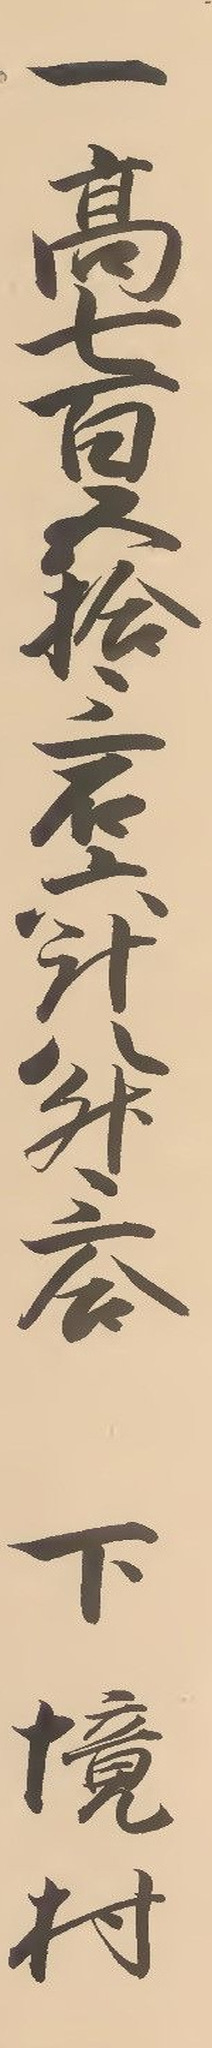一高七百五拾三石六斗八升三合下境村
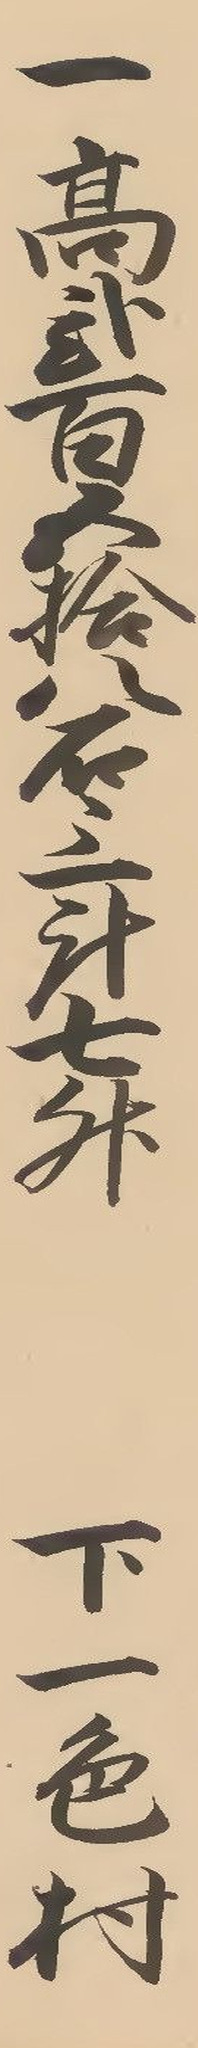一高弐百五拾八石三斗七升下一色村
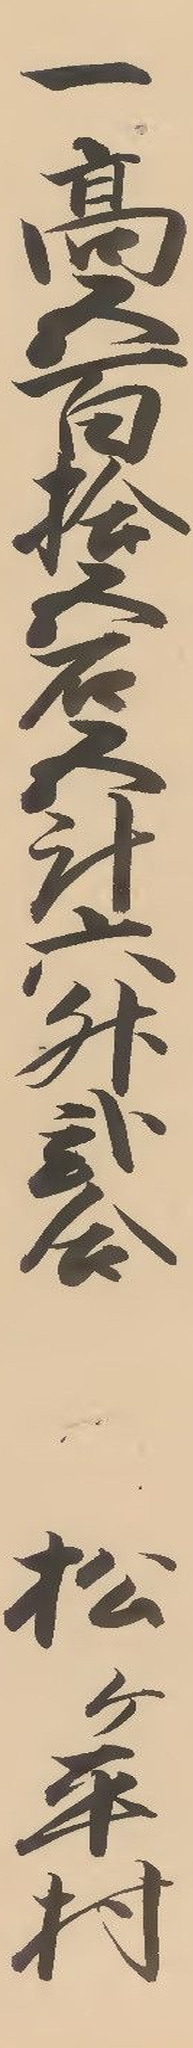一高五百拾五石五斗六升弐合松ヶ平村

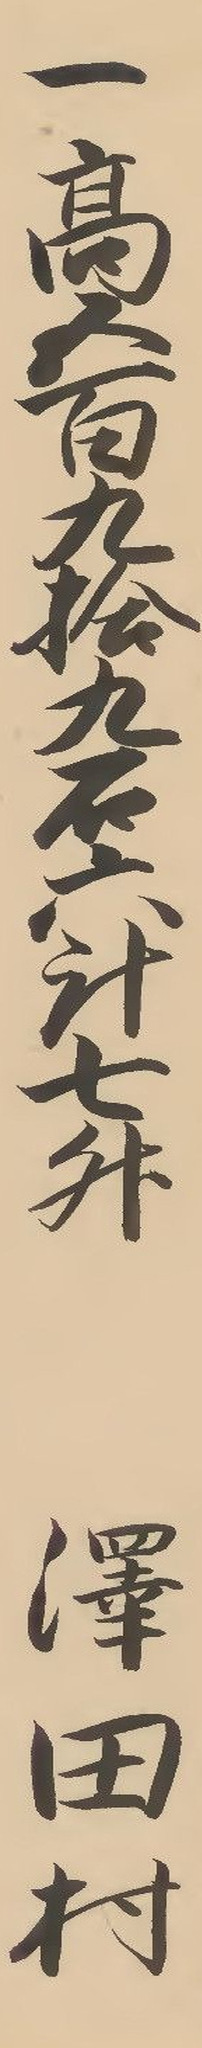一高五百九拾九石六斗七升沢田村
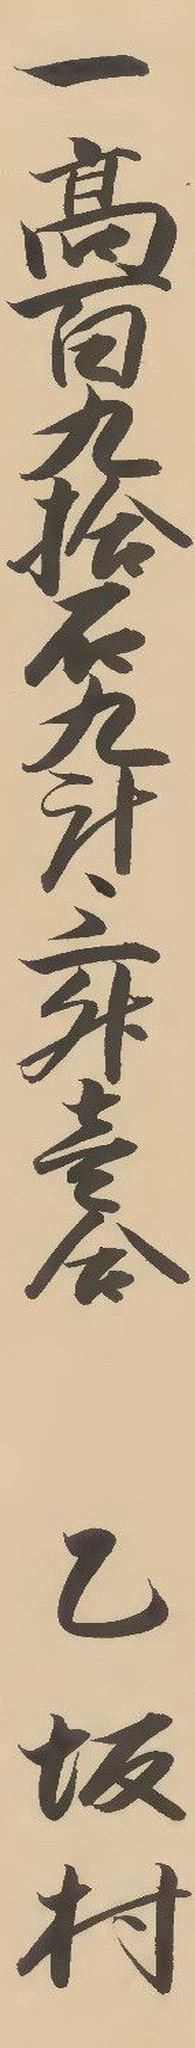一高百九拾石九斗三升壱合乙坂村
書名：美濃国郷帳
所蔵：国立公文書館 National Archives of Japan
